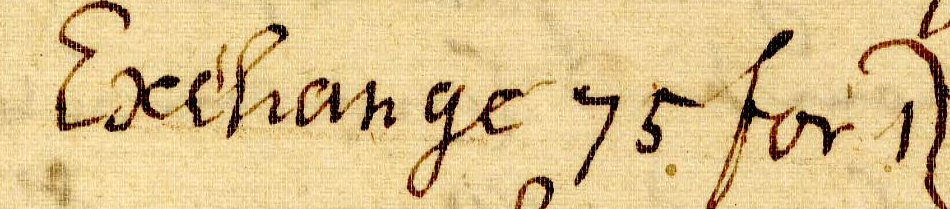Exchange 75 for 1
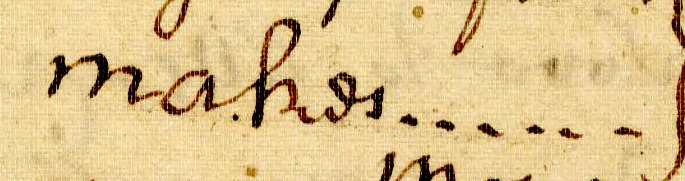makes......
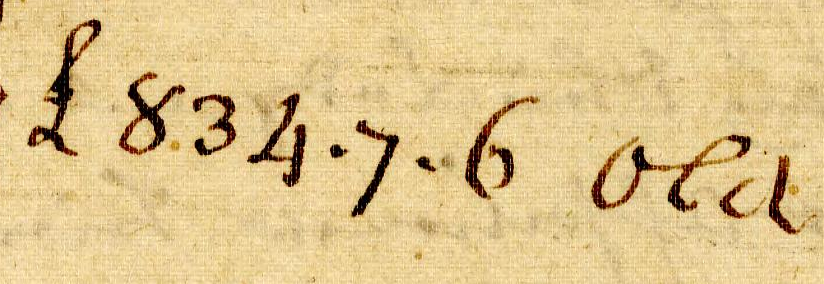£834.7.6 Old Cont
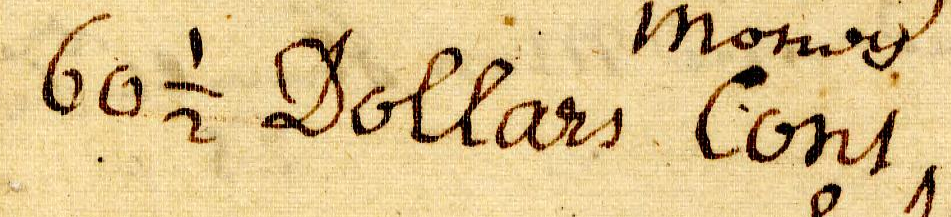60 1/2 Dollars Cont
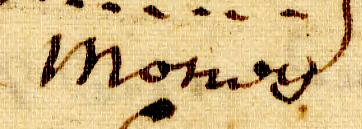Money
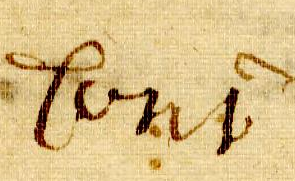Cont
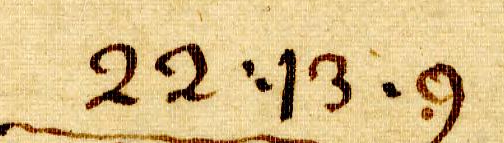22.13.9
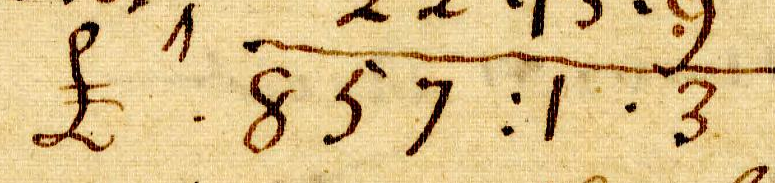£857:1.3
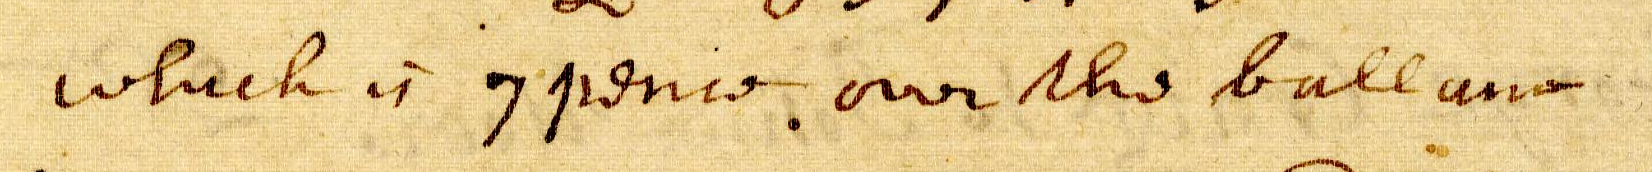Which is 7 pence over the ballance
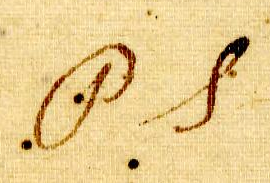PS
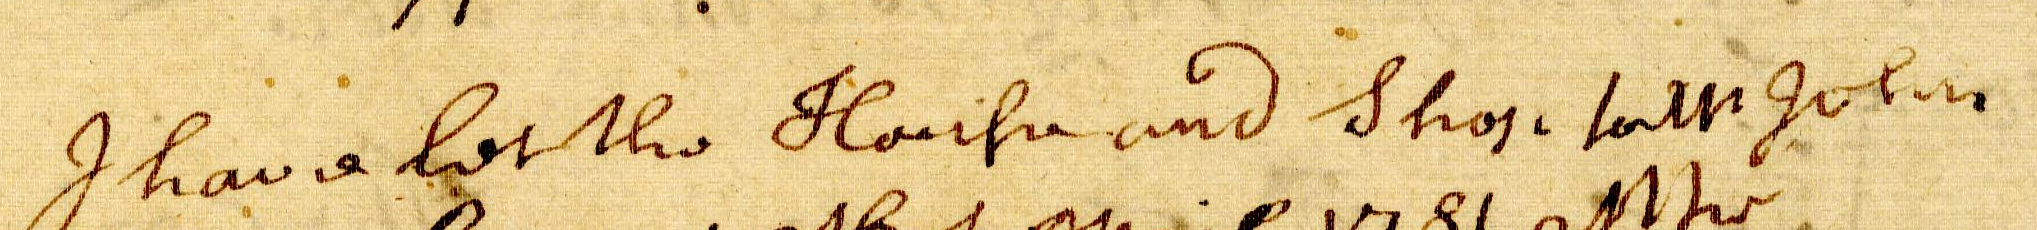I have let the House and Shop to M^r John
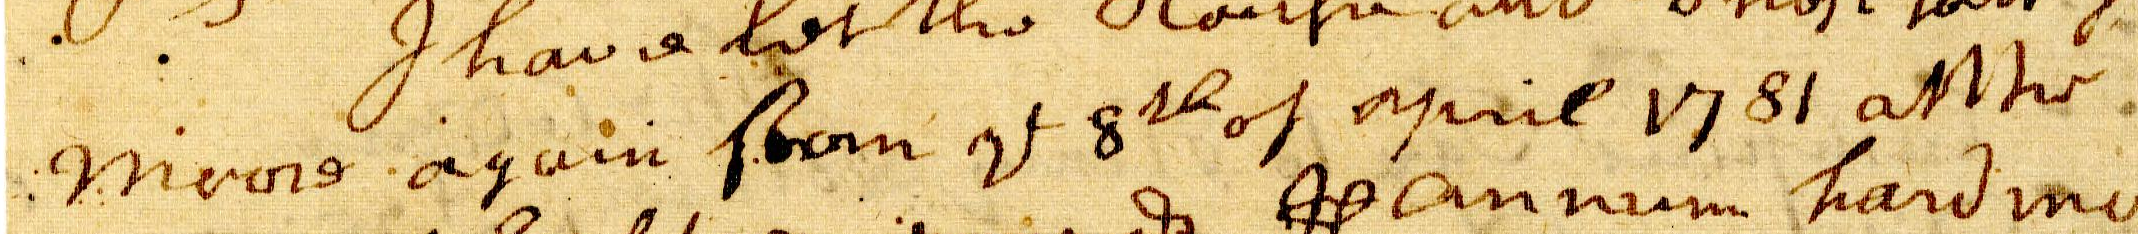Moore again from y^e 8^th of april 1781 at the
